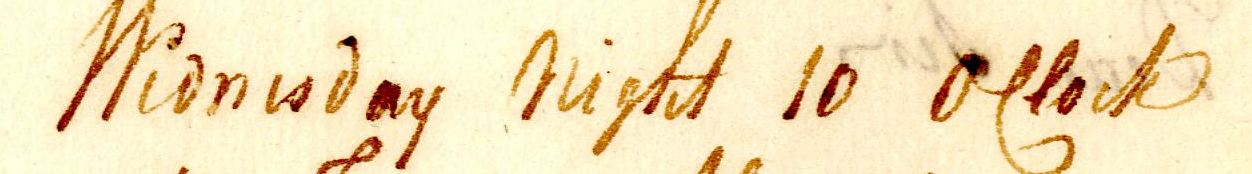Wednesday night 10 oClock
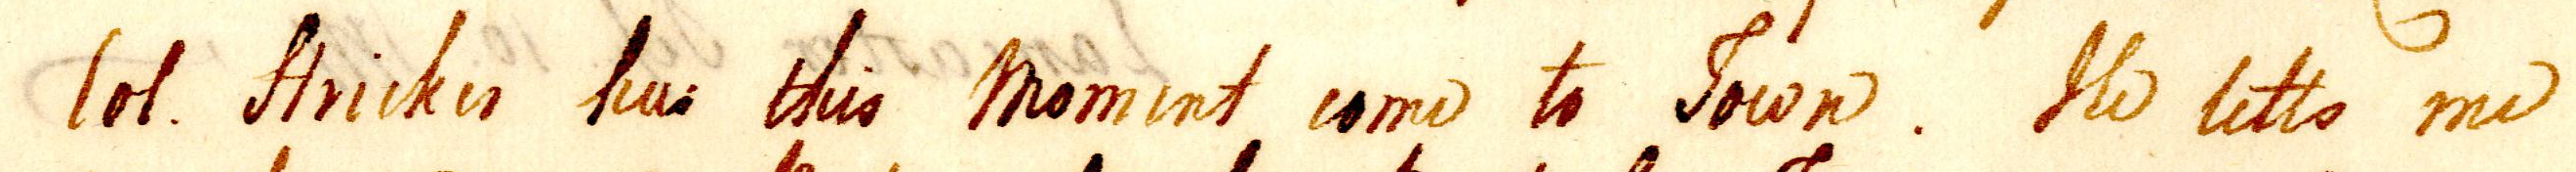Col. Strickes has this Moment come to Town. He letts me
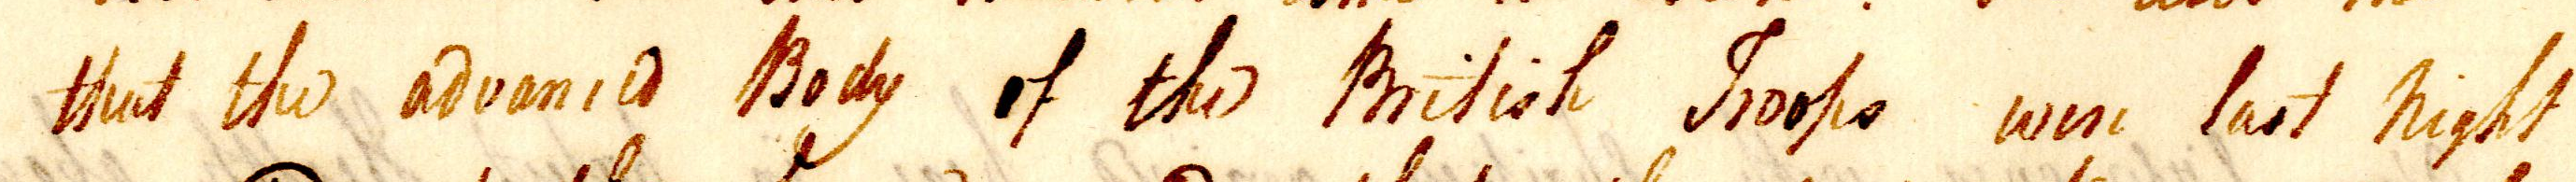that the advanced Body of the British Troops were last night
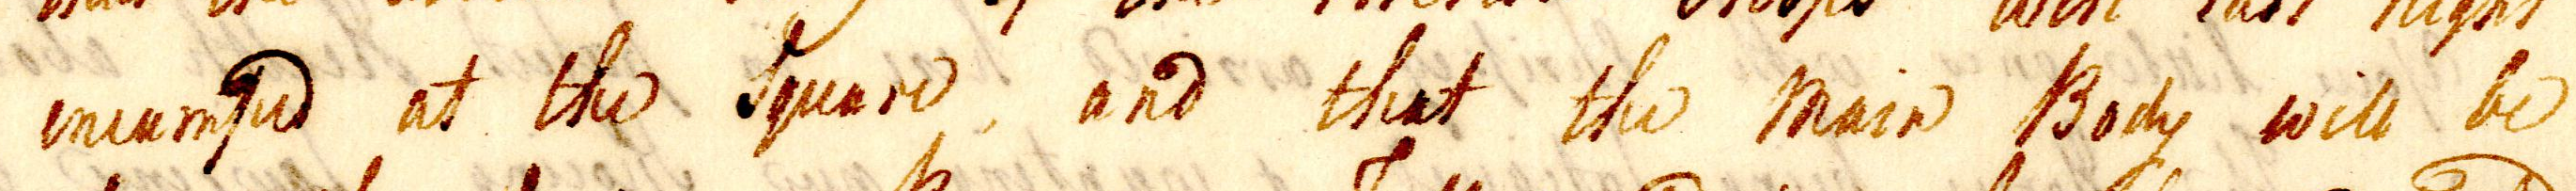encamped at the Square and that the Main Body will be
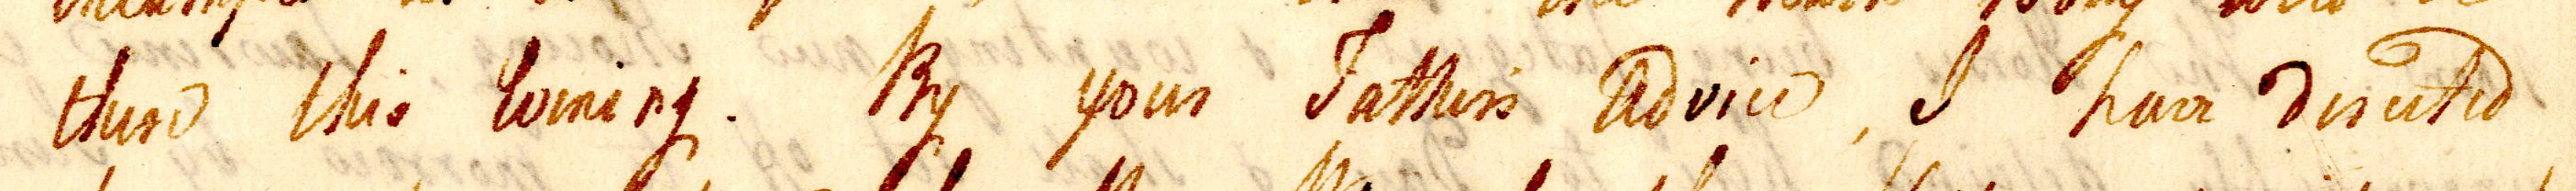there this Evening. By your Fathers advice, I have directed
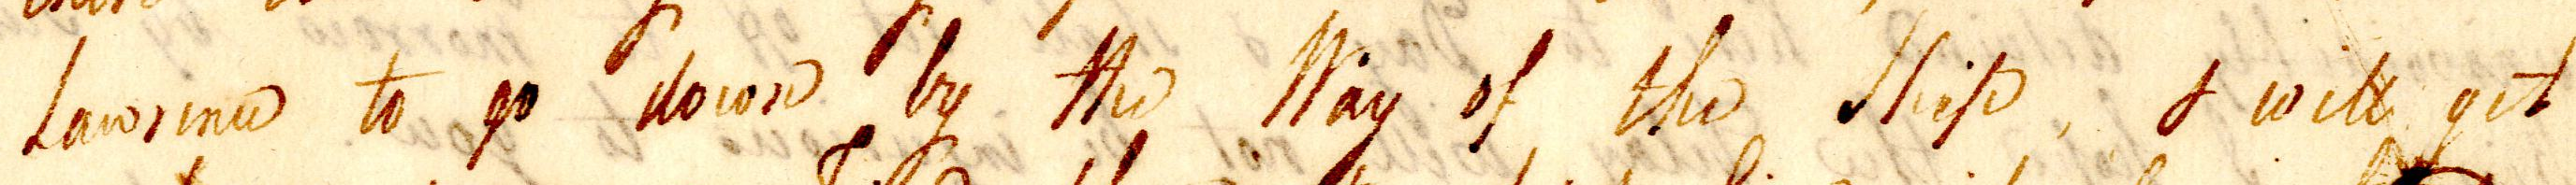Lawrence to go down by the Way of the Ship, & will get
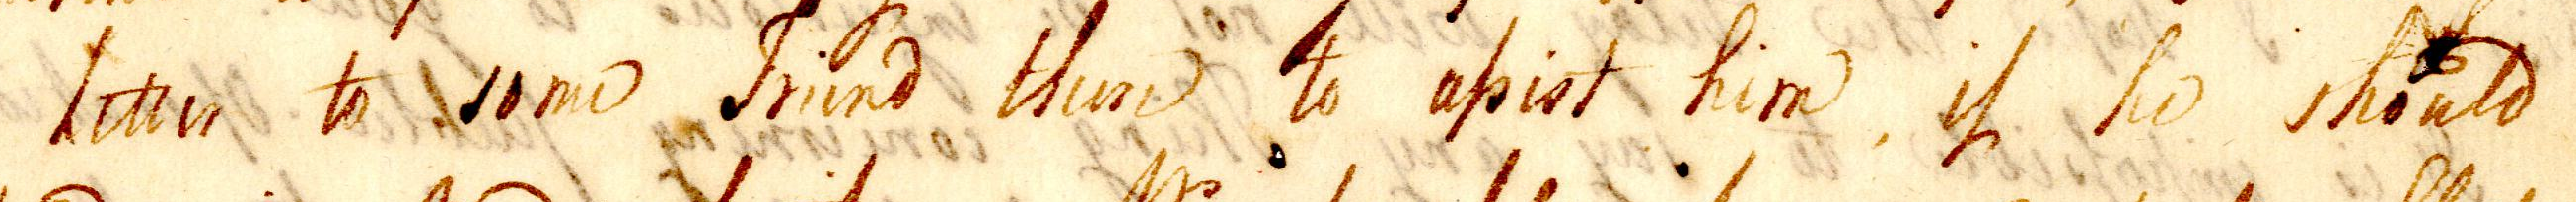Letter to some Friend there to assist him, if he should
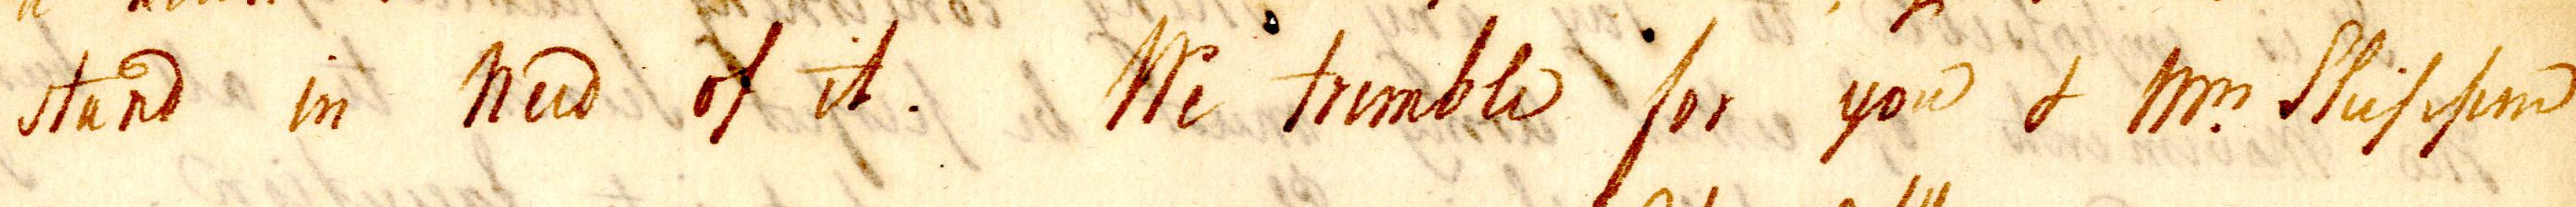stand in need of it. We tremble for you & M^rs. Shippen.
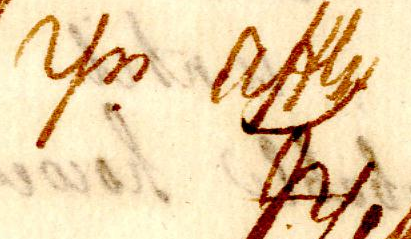Yrs Affly
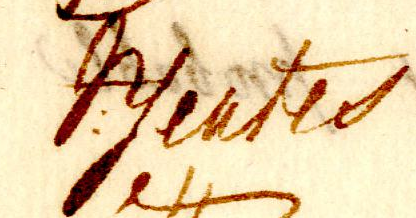J: Yeates
